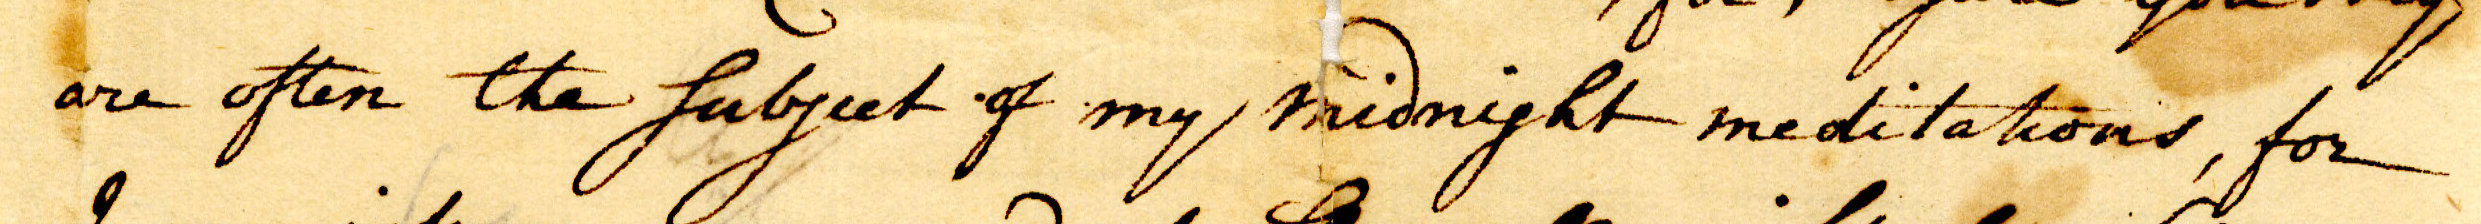are often the Subject of my midnight meditations, for
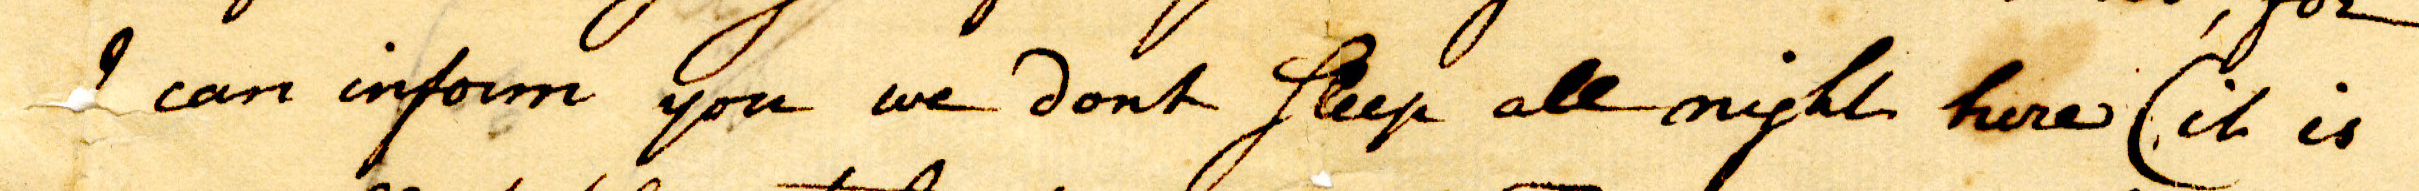I can inform you we dont sleep all night here (it is
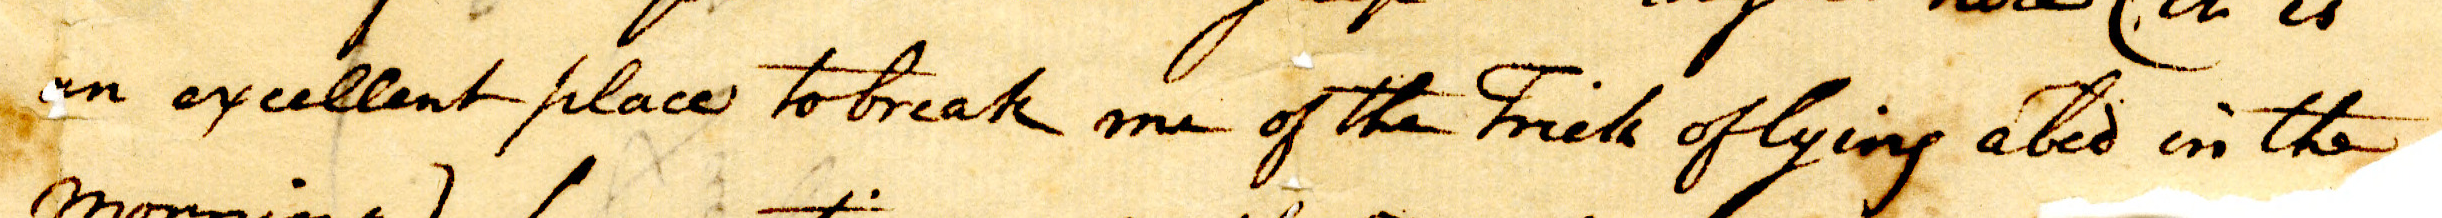an excellent place to break me of the Trials of lying abed in the
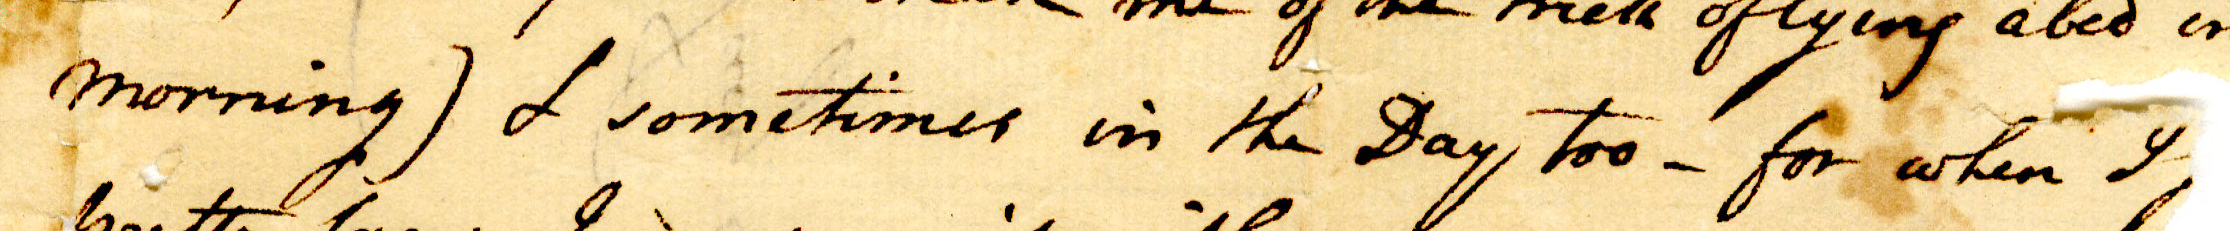morning) I sometimes in the Day too- for when y
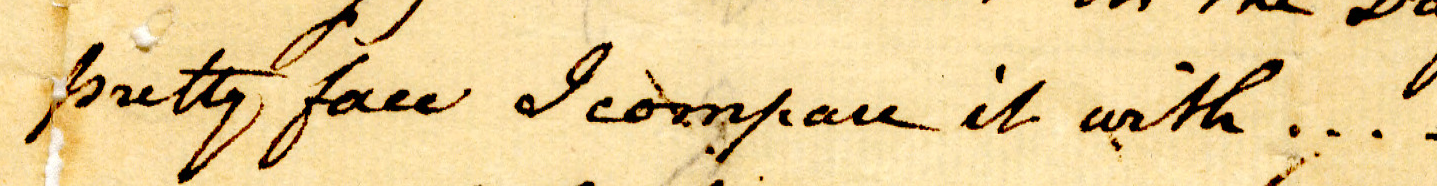pretty face I compare it with...
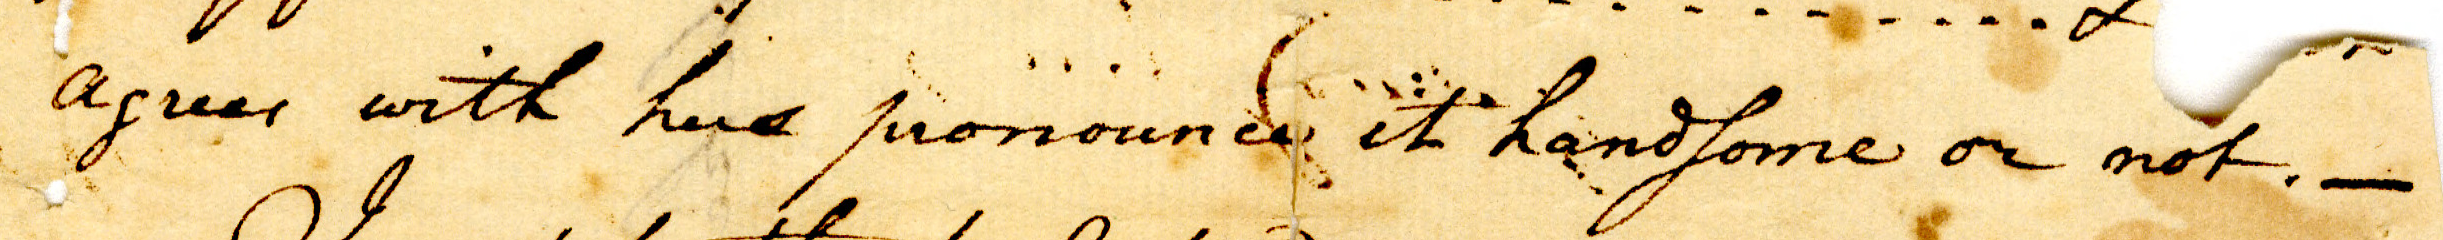agree with his pronounce it handsome or not.-
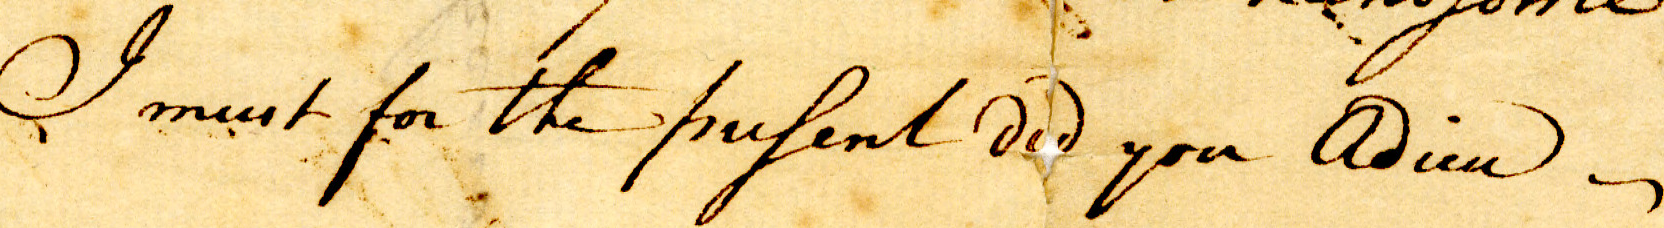I must for the present did you Adieu-
